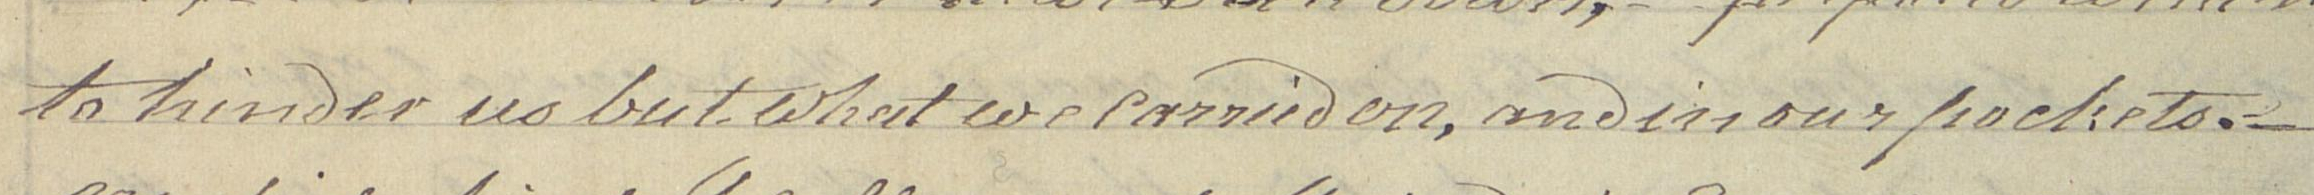to hinder us but what we carried on, and in our pockets.
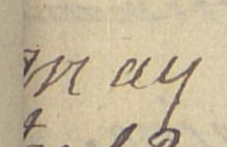may
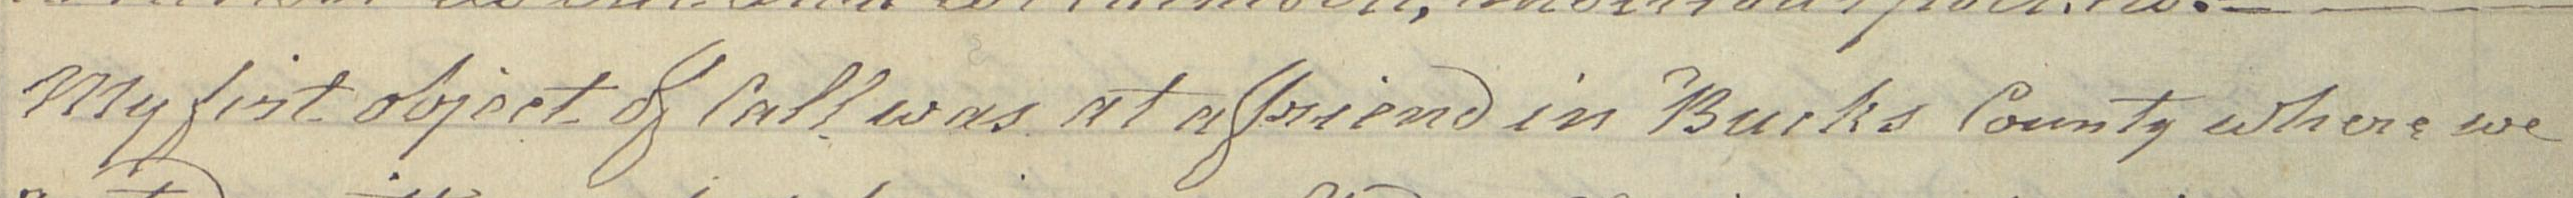My first object of Call was at a friend in Bucks County where we
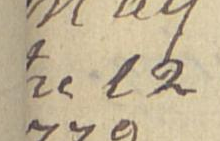-re 12
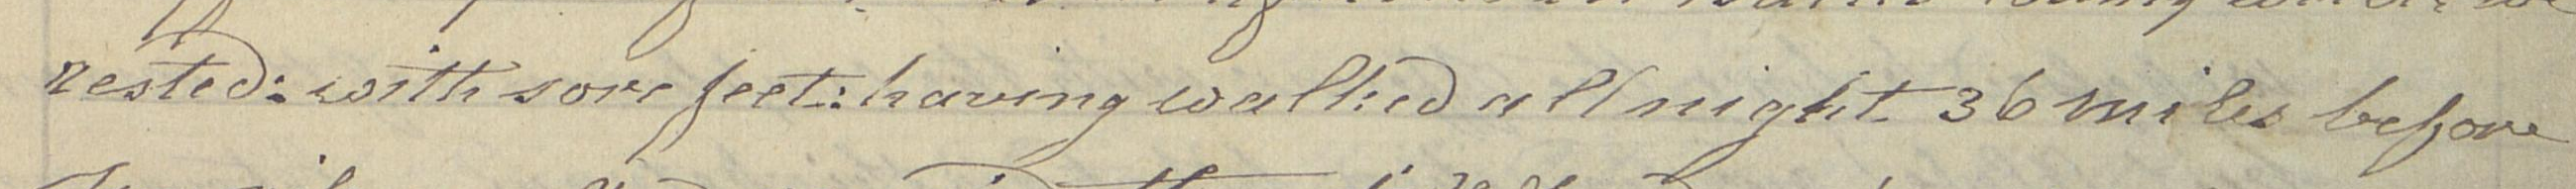rested: with sore feet having wallied 1^e^t night 36 miles before
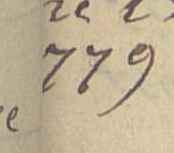-779
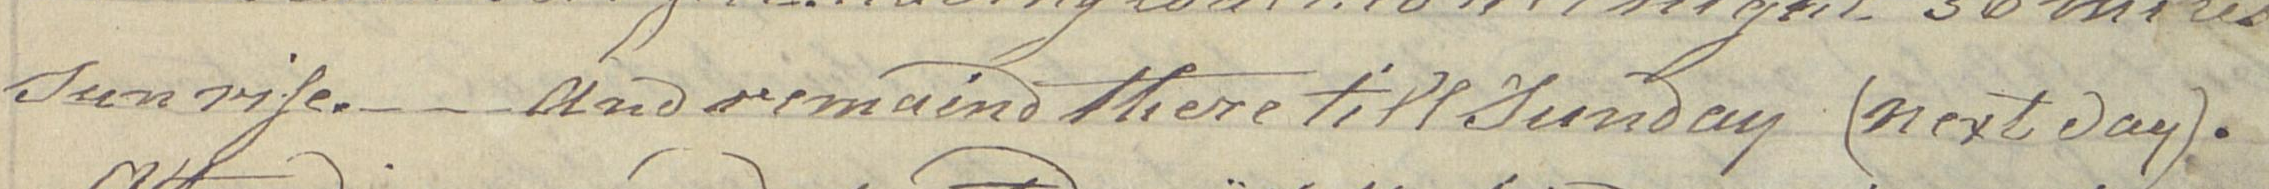Sun rise. and remaind there till Sunday (next day).
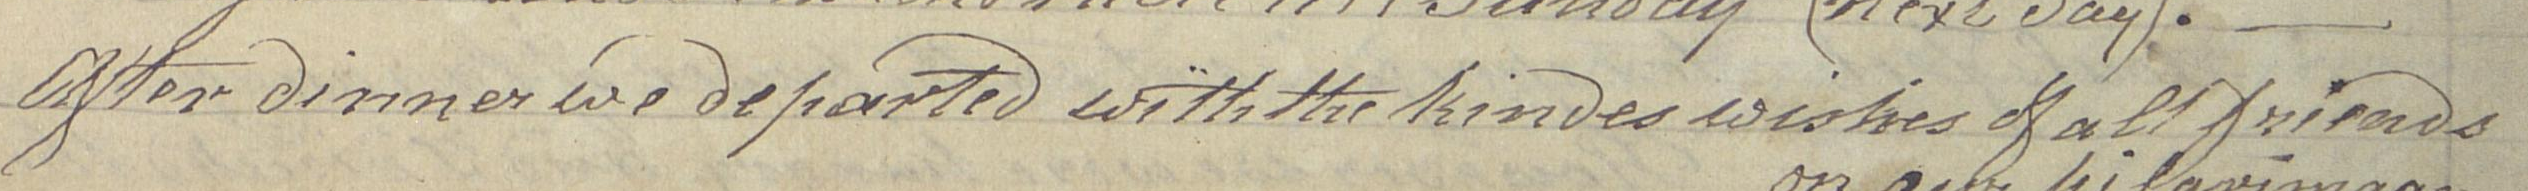after dinner we departed with the kindes wishes of all friends
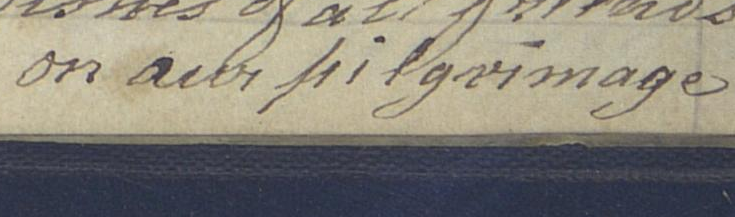on our pilgramage
